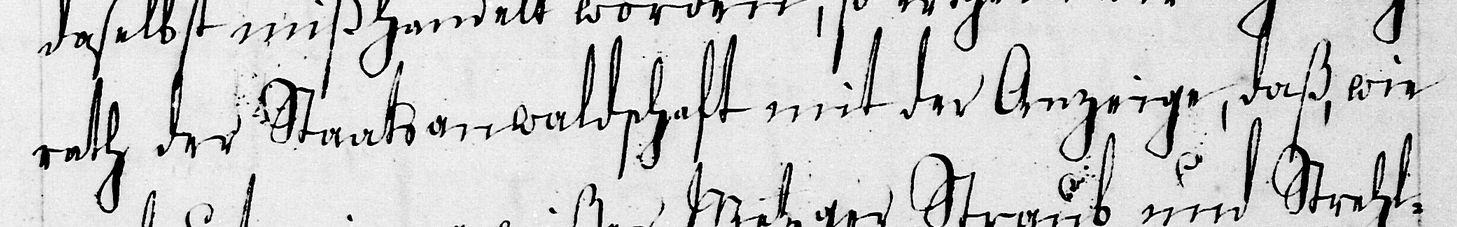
rath der Straatsanwaldschaft mit der Anzeige, daß, wie
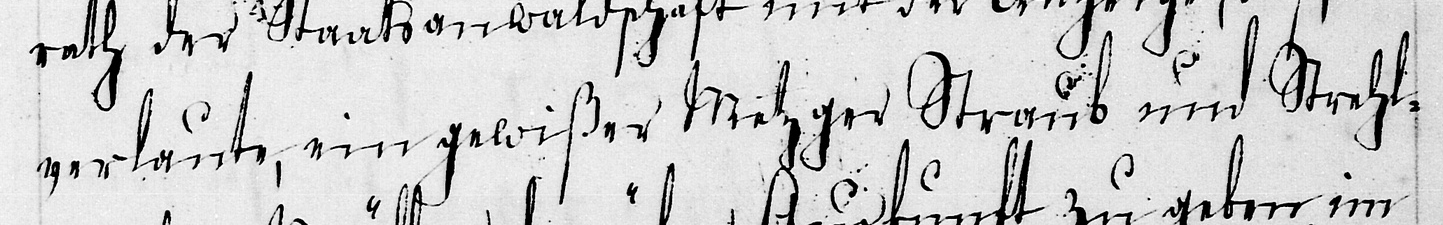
verlaute, ein gewißer Metzger Straub und Strehl¬
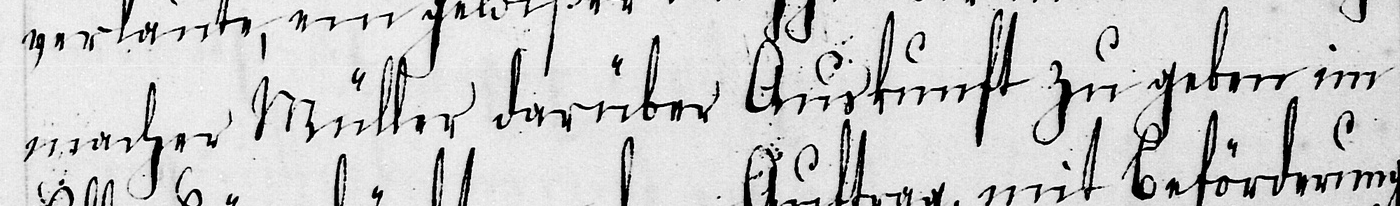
macher Müller darüber Auskunft zu geben im
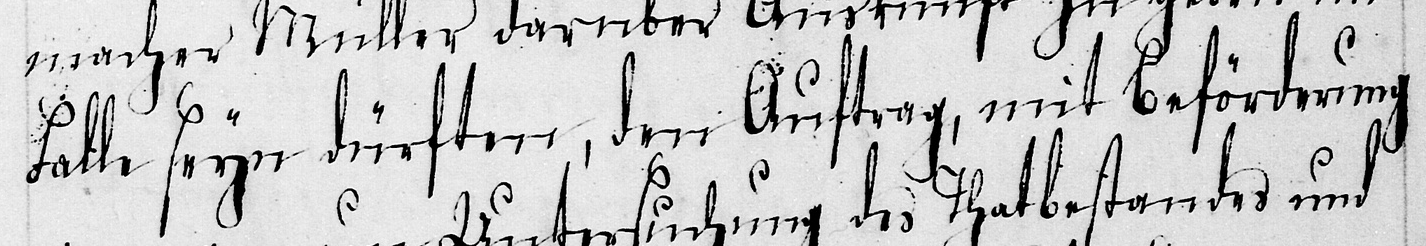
Falle seyn dürften, den Auftrag, mit Beförderung
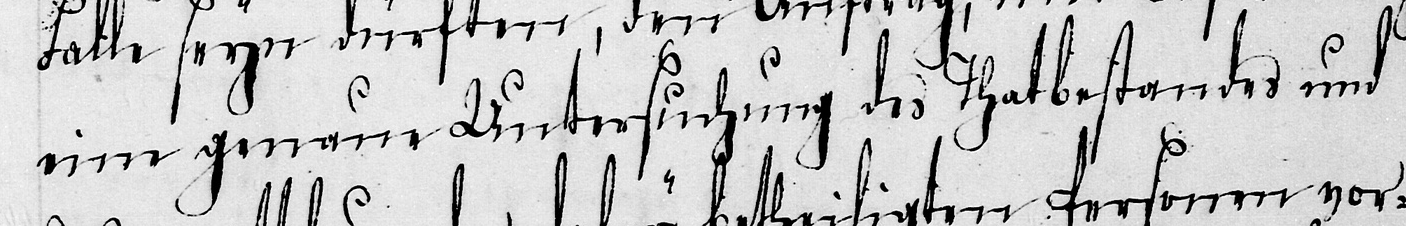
eine genaue Untersuchung des Thatbestandes und
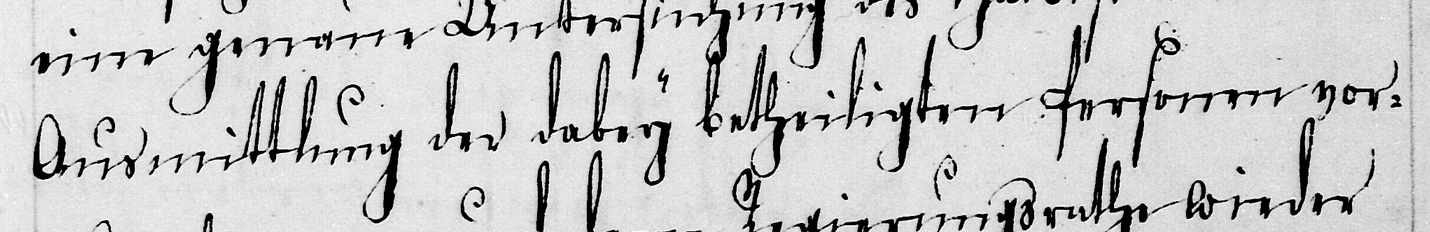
Ausmittlung der dabey betheiligten Personen vor¬
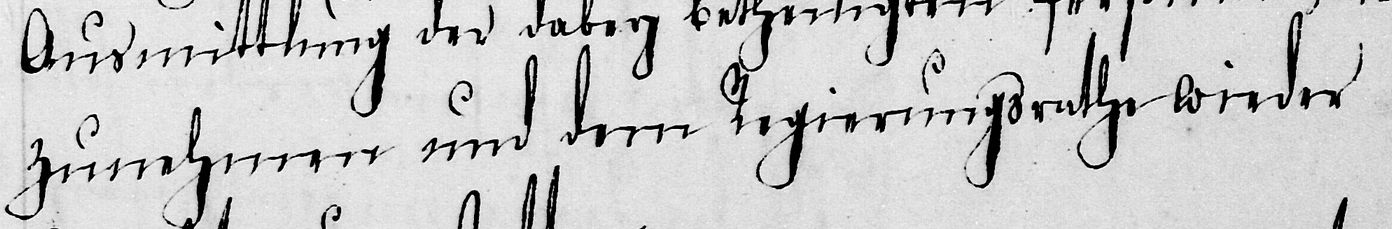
zunehmen und dem Regierungsrathe wieder
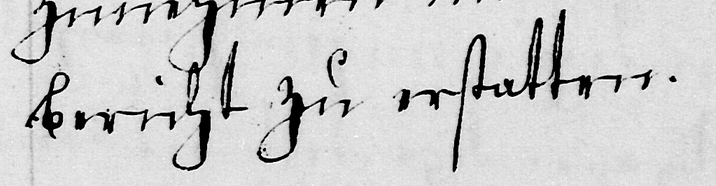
Bericht zu erstatten.
